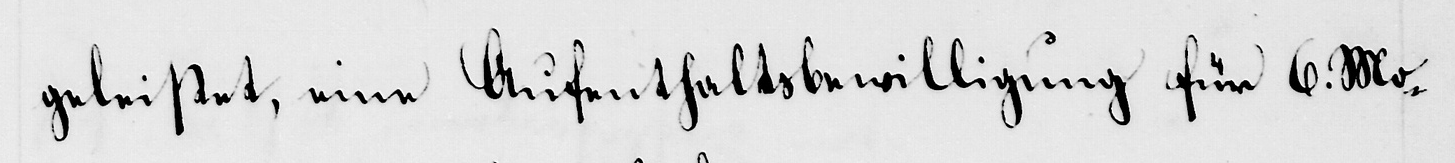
geleistet, eine Aufenthaltsbewilligung für 6. Mo¬
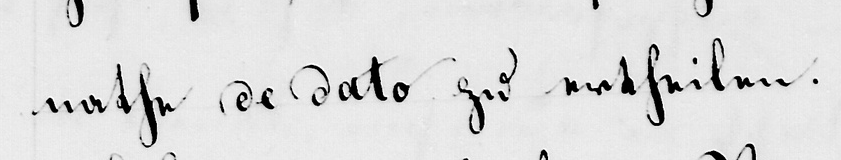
nathe de dato zu ertheilen.
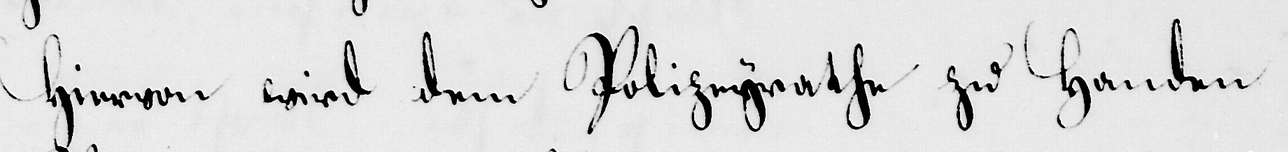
Hiervon wird dem Polizeyrathe zu Handen
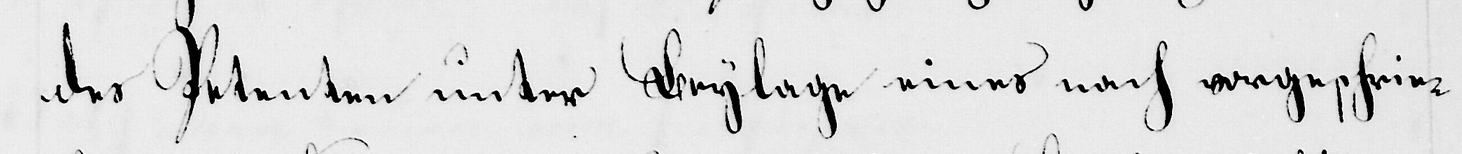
des Petenten unter Beylage eines nach vorgeschrie¬
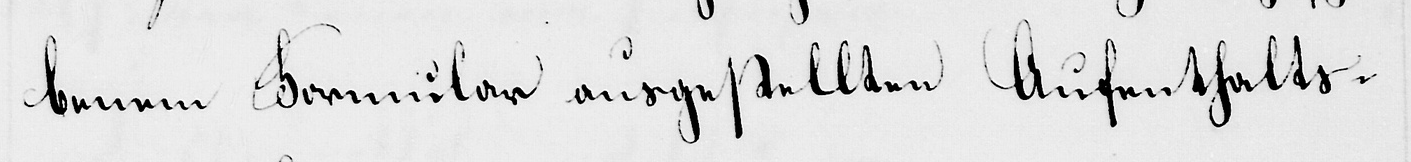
benem Formular ausgestellten Aufenthalts¬
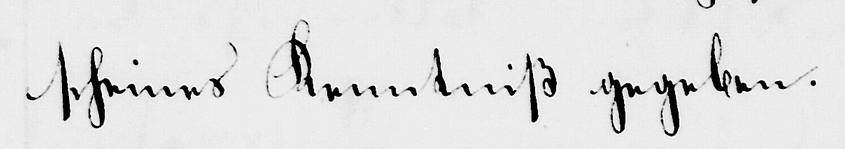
scheines Kenntniß gegeben.
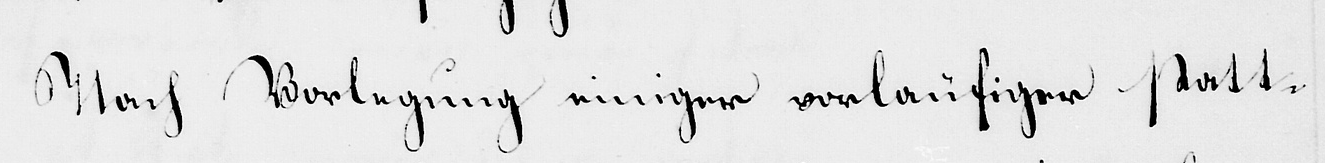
Nach Vorlegung einiger vorläufiger statt¬
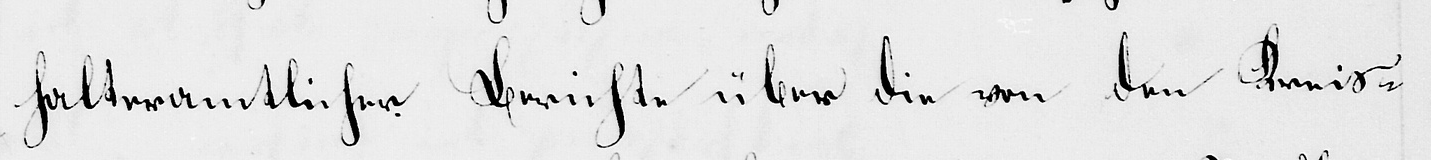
halteramtlicher Berichte über die von den Kreis¬
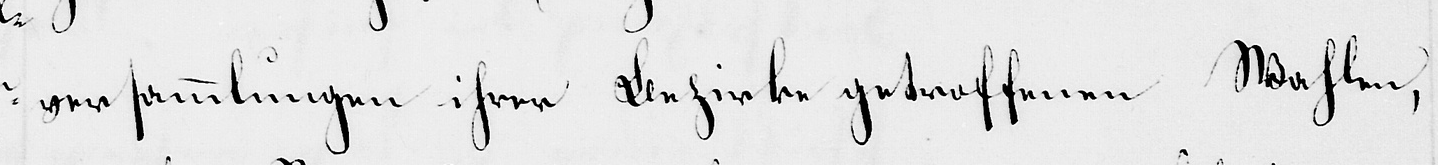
versammlungen ihrer Bezirke getroffenen Wahlen,
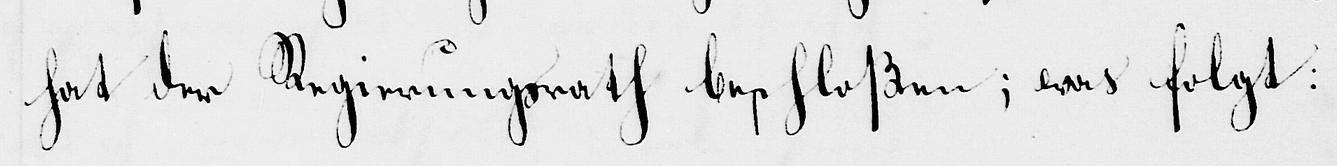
hat der Regierungsrath beschloßen; was folgt:
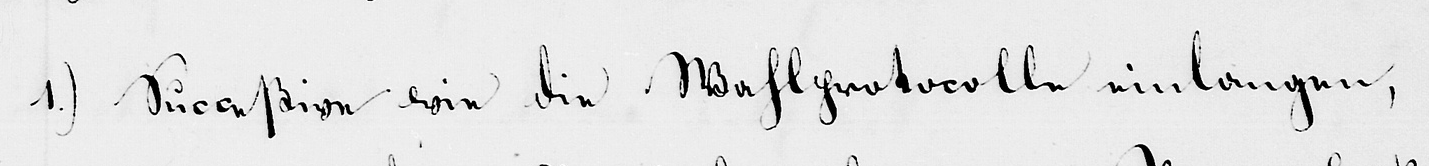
1.) Succeßive wie die Wahlprotocolle einlangen,
